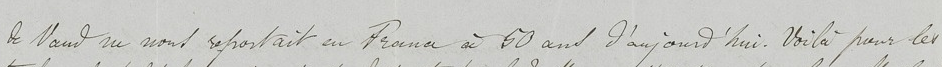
de Vaud ne nous reportait en France à 50 ans d'aujourd'hui. Voilà pour les
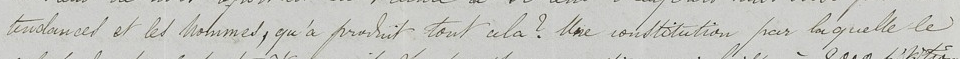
tendances et les hommes, qu'a produit tout cela? Une constitution par laquelle le
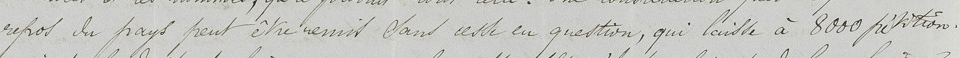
repos du pays peut être remis sans cesse en question, qui laisse à 8000 pétition-
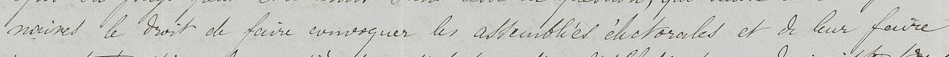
naires le droit de faire convoquer les assemblées électorales et de leur faire
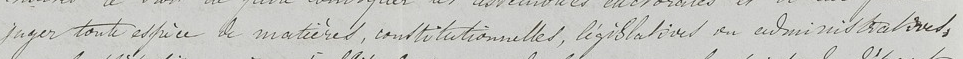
juger toute espèce de matières, constitutionnelles, législatives ou administratives,
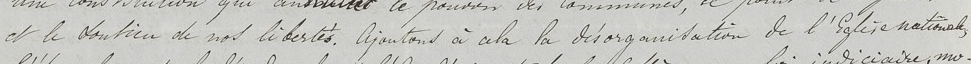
et le soutien de nos libertés. Ajoutons à cela la désorganisation de l'Eglise nationale,
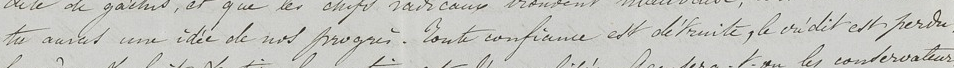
tu auras une idée de nos progrès. Toute confiance est détruite, le crédit est perdu,
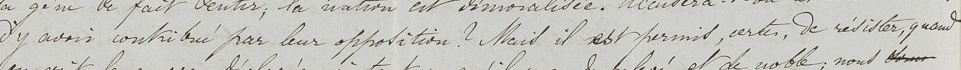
d'y avoir contribué par leur opposition? Mais il est permis, certes, de résister, quand
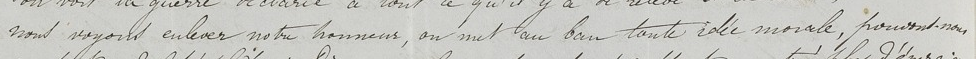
nous voyons enlever notre honneur, on met au ban toute idée morale, pouvons-nous
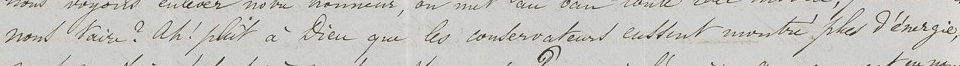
nous taire? Ah! plût à Dieu que les conservateurs eussent montré plus d'énergie,
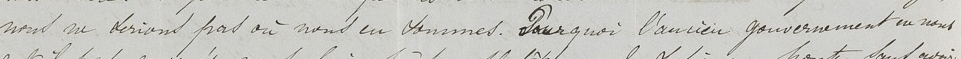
nous ne serions pas où nous en sommes. Pourquoi l'ancien Gouvernement ne nous
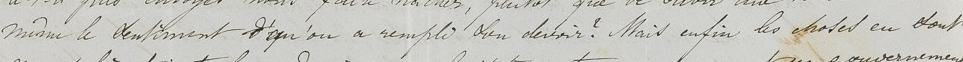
même le sentiment d' qu'on a rempli son devoir? Mais enfin les choses en sont
